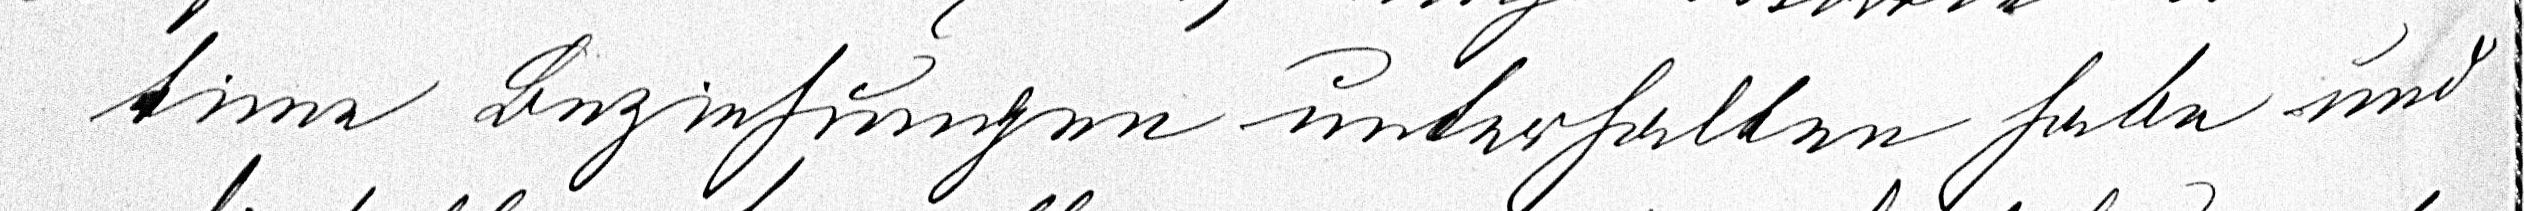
time Beziehungen unterhalten habe und
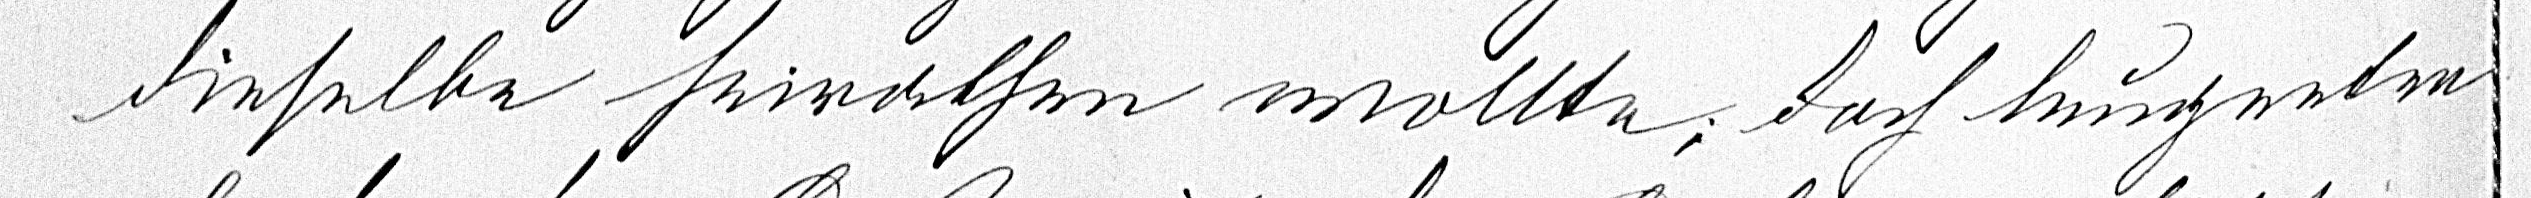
dieselbe heirathen wollte, doch leugneten
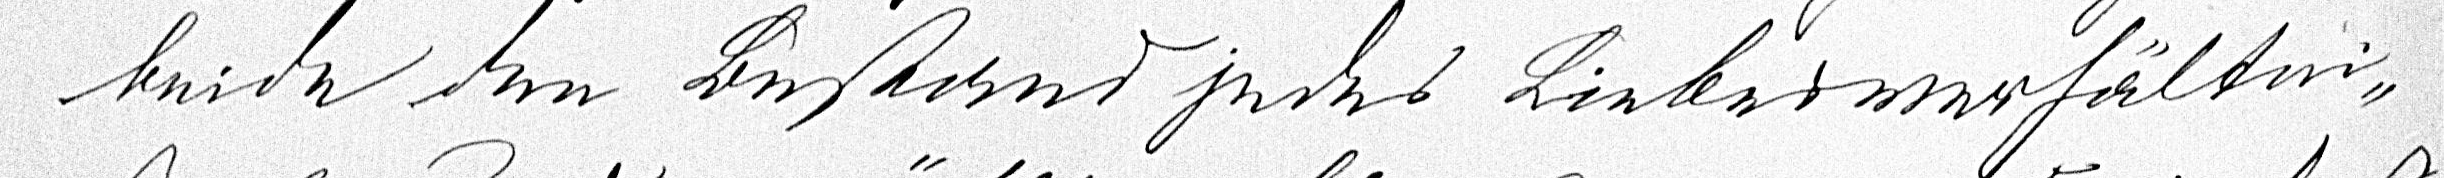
beide den Bestand jedes Lieberverhältni¬
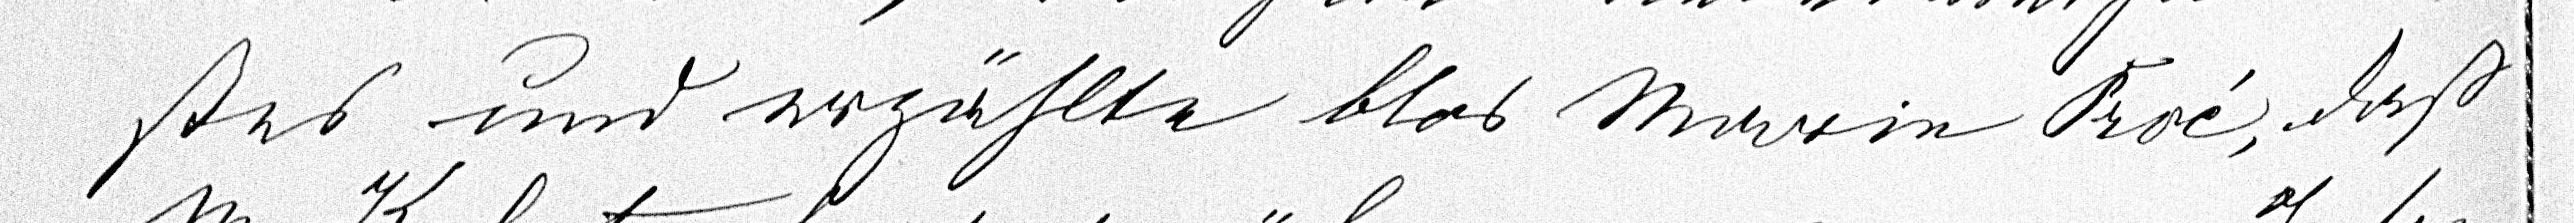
ßes und erzählte blos Marie Proć, daß
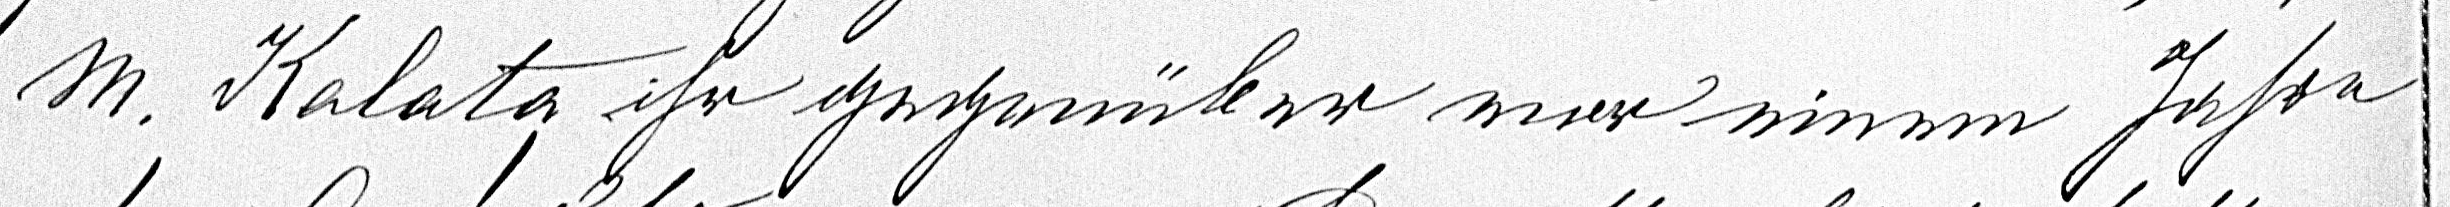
M. Kalata ihr gegenüber war einem Jahre
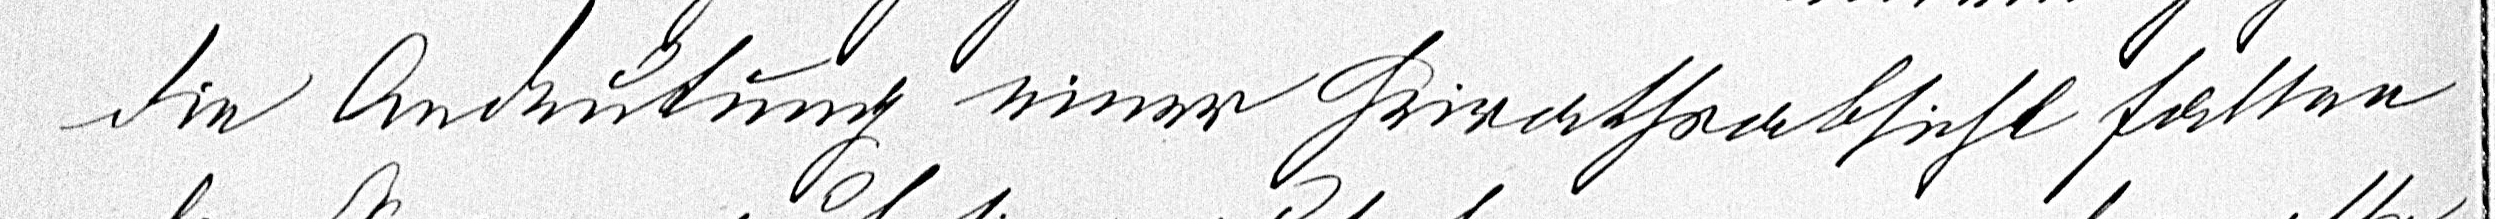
die Andeutung einer Heirathsabsicht fallen
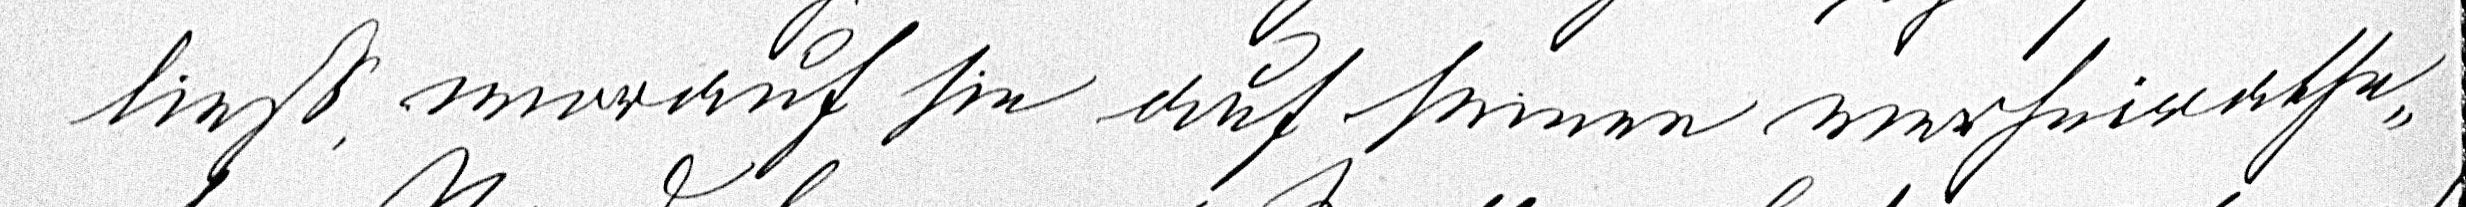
ließ, worauf sie auf seinen verheirathe¬
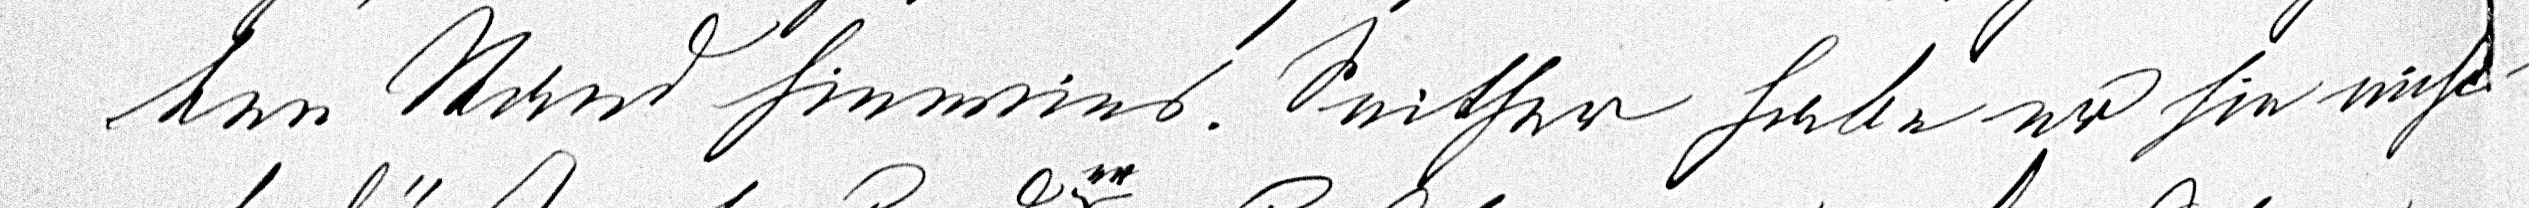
ten Stand hinwies. Seither habe er sie nicht
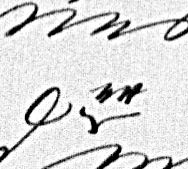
er
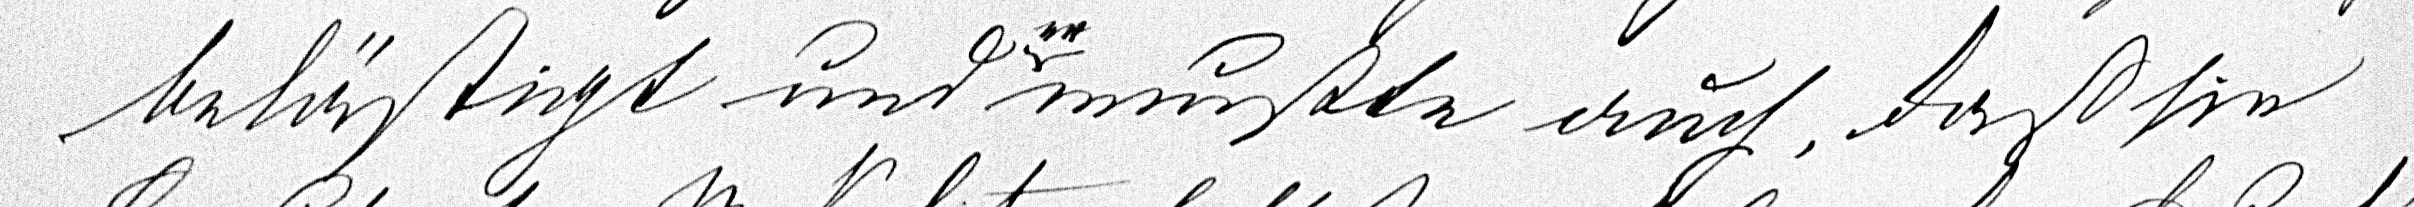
belästigt und wußte auch, daß sie
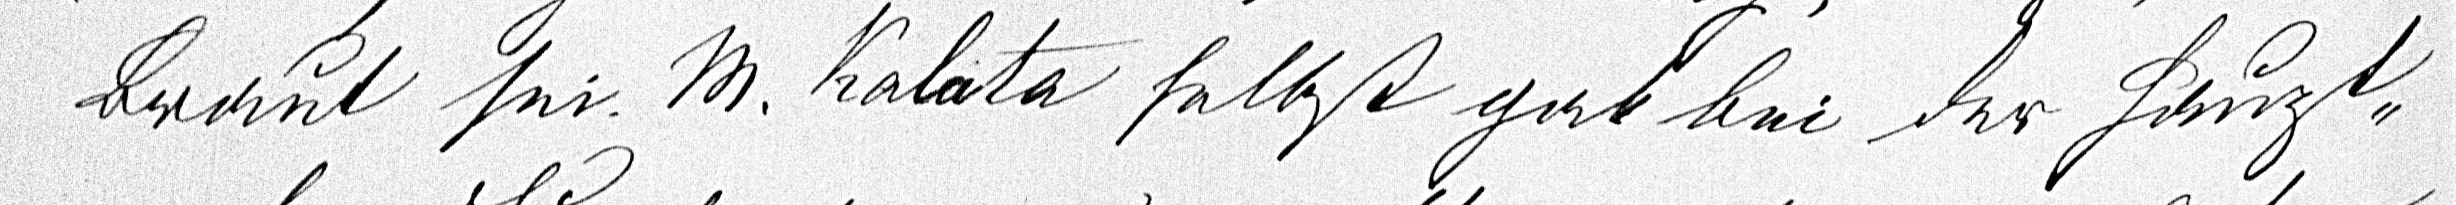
Braut sei. M. Kalata selbst gab bei der Haupt¬
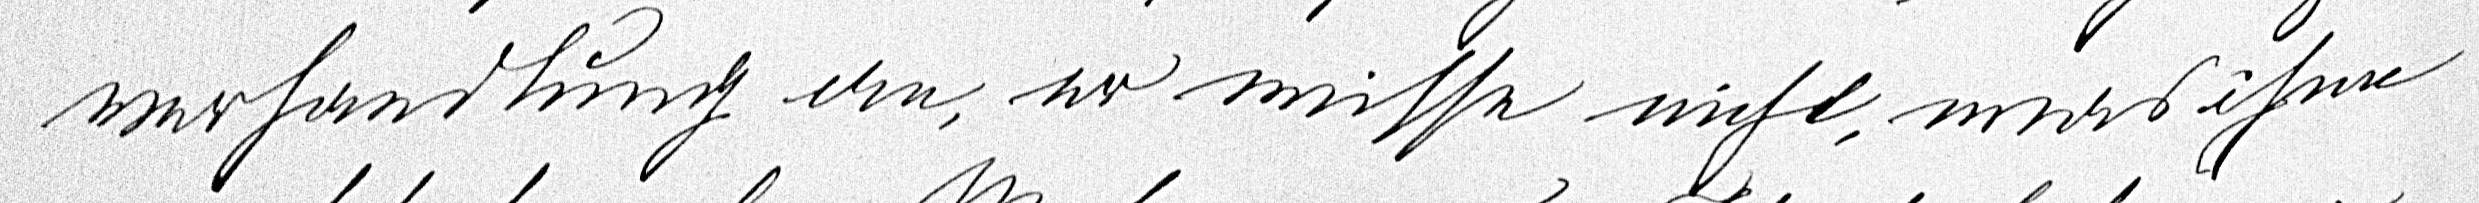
verhandlung an, er wisse nicht, was ihne
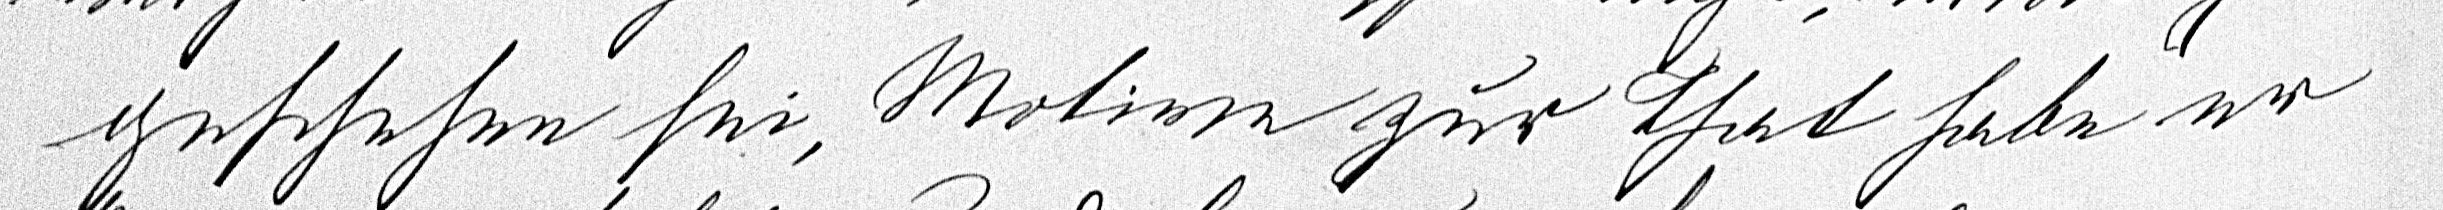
geschehen sei, Motive zur That habe er
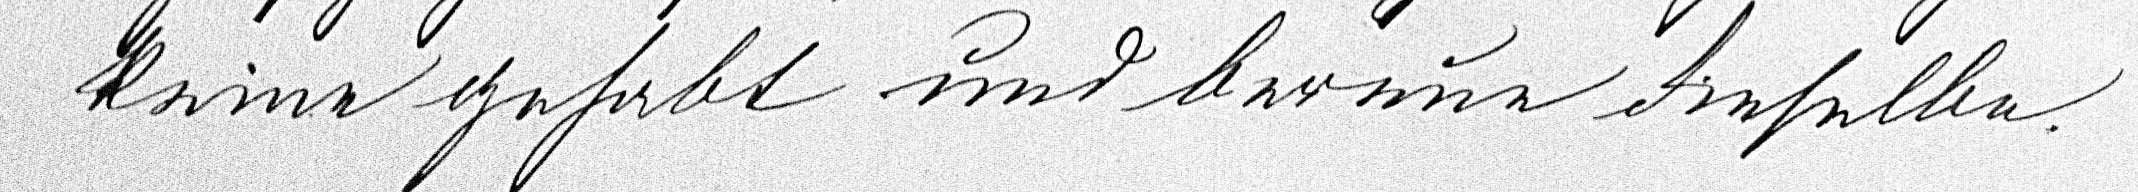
keine gehabt und bereue dieselbe.
